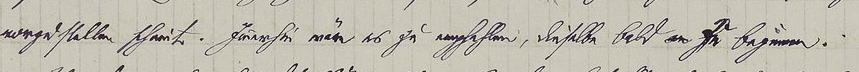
vorzustellen scheint. Immerhin wäre es zu empfehlen, dieselbe bald zu beginnen.
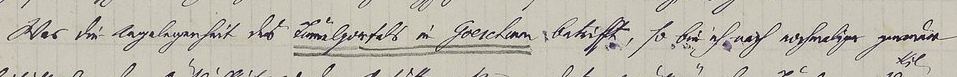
Was die Angelegenheit des Tunnelportals in Goeschenen betrifft, so bin ich nach nochmaliger genauer
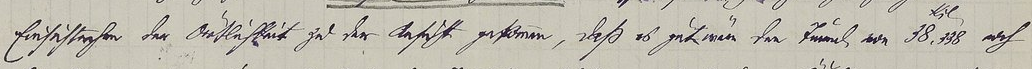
Einsichtnahme der Örtlichkeit zu der Ansicht gekommen, daß es gut wäre den Tunnel von 38,338 Kil. noch
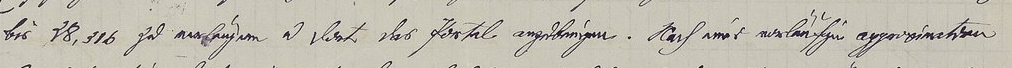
bis 38,316 zu verlängern & dort das Portal anzubringen. Nach einer vorläufigen approximativen
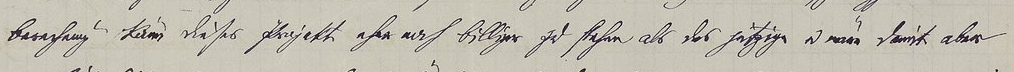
Berechnung käme dieses Projekt eher noch billiger zu stehen als das jetzige & wäre damit aber
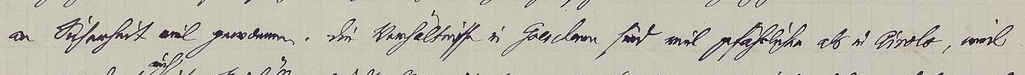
an Sicherheit viel gewonnen. Die Verhältnisse in Goeschenen sind viel gefährlicher als in Airolo, weil
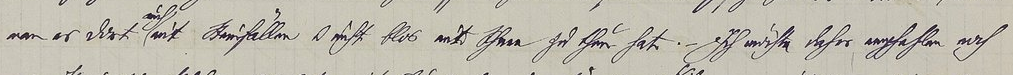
man es dort auch mit Steinfällen & nicht blos mit Schnee zu thun hat. Ich möchte daher empfehlen noch
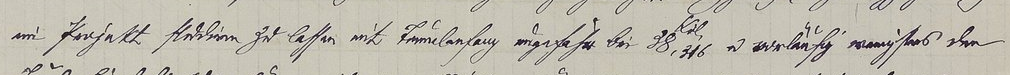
ein Projekt studiren zu lassen mit Tunnelanfang ungefähr bei 38,316 Kil. & vorläufig wenigstens den
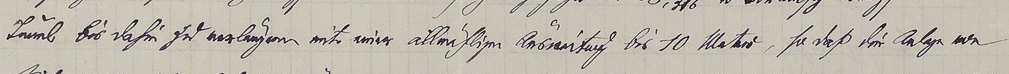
Tunnel bis dahin zu verlängern mit einer allmähligen Ausweitung bis 10 Meter, so daß die Anlage von
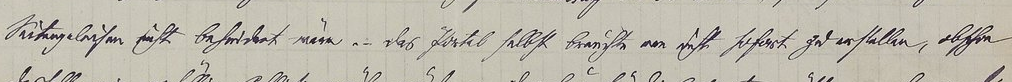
Seitengeleisen nicht behindert wäre. – Das Portal selbst brauchte man nicht sofort zu erstellen, obschon
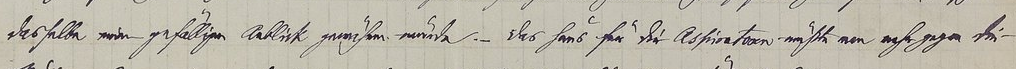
dasselbe einen gefälligen Anblick gewähren würde. – Das Haus für die Aspiratoren müßte man mehr gegen die
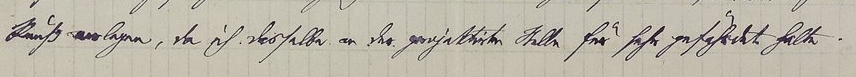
Reuß verlegen, da ich dasselbe an der projektirten Stelle für sehr gefährdet halte.
